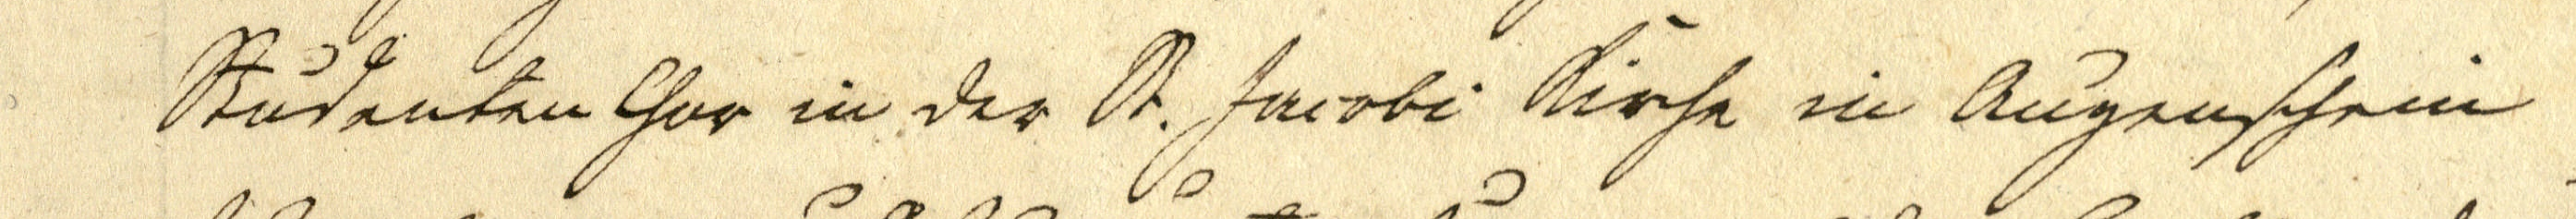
Studenten Chor in der St. Jacobi Kirche in Augenschein
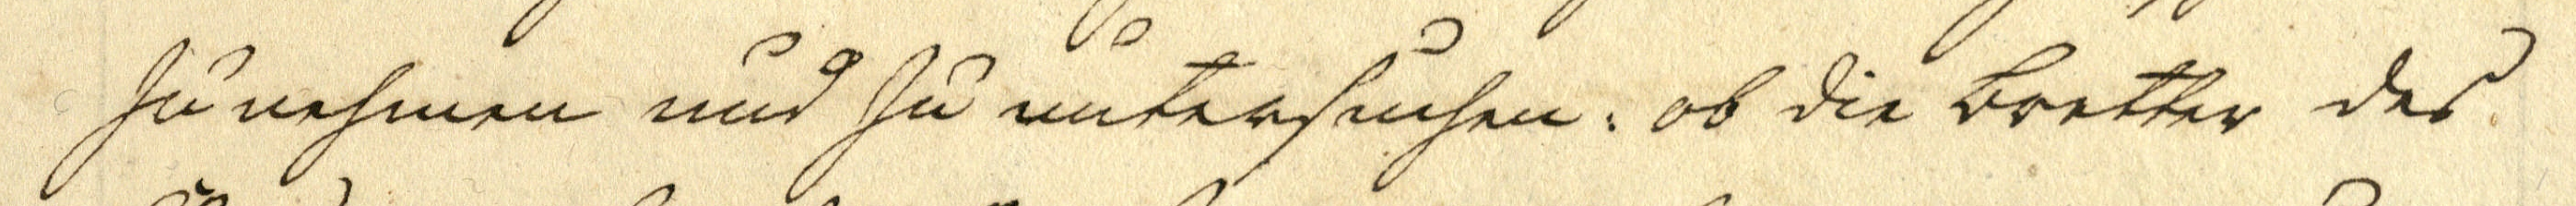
zu nehmen und zu untersuchen, ob die Bretter des
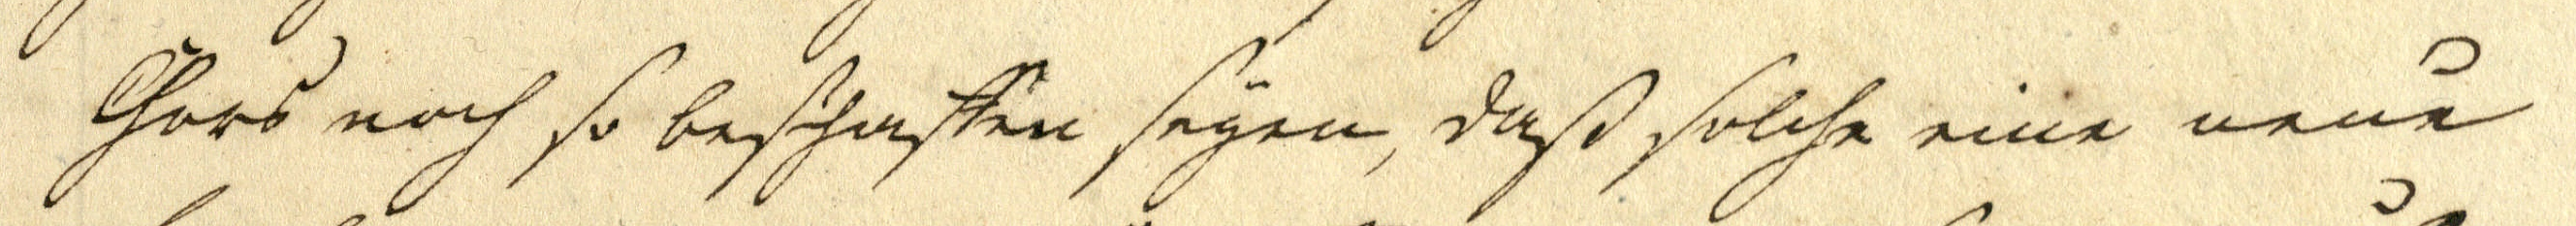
Chors noch so beschaffen seÿen, daß solche eine neue
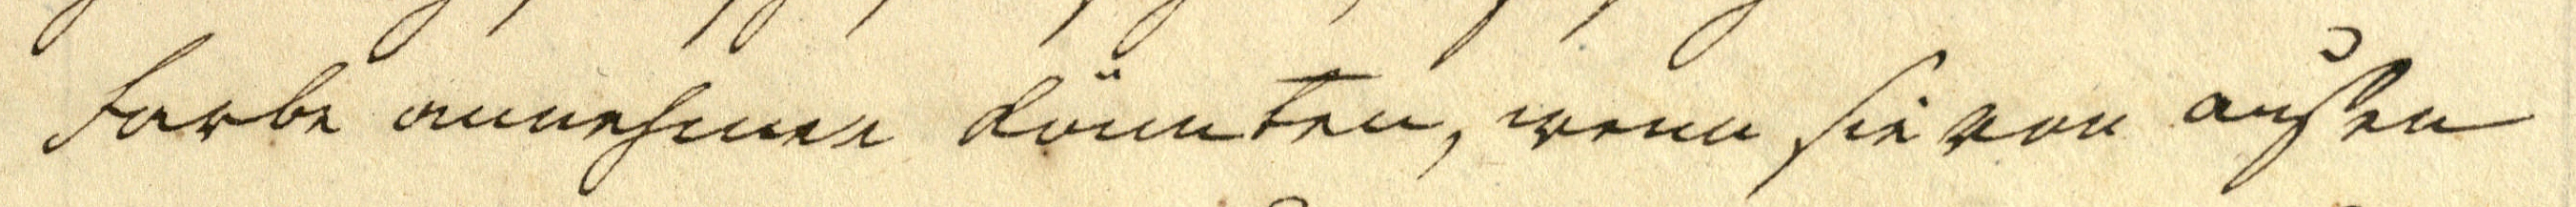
Farbe annehmen könnten, wenn sie von außen
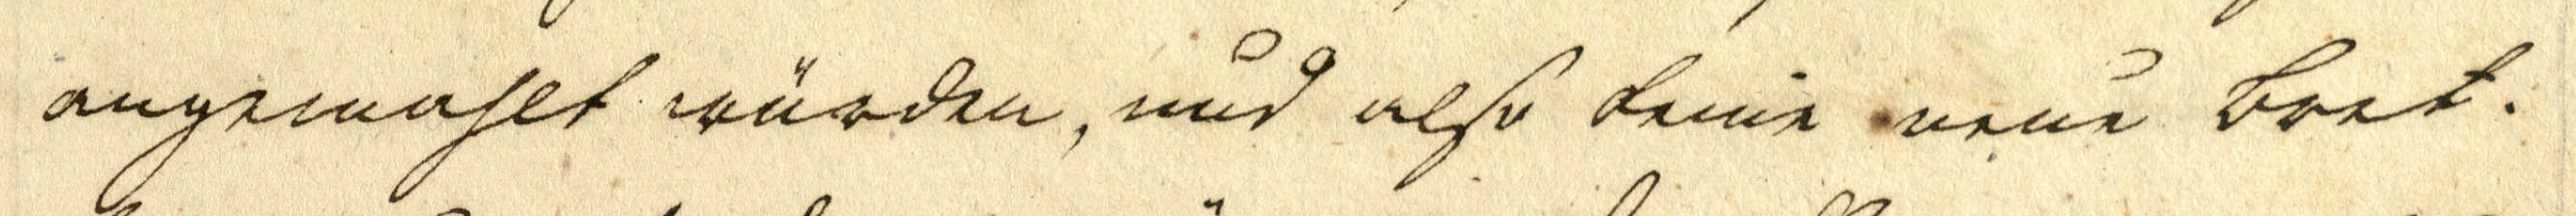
angemahlt würden, und also keine neue Bret¬
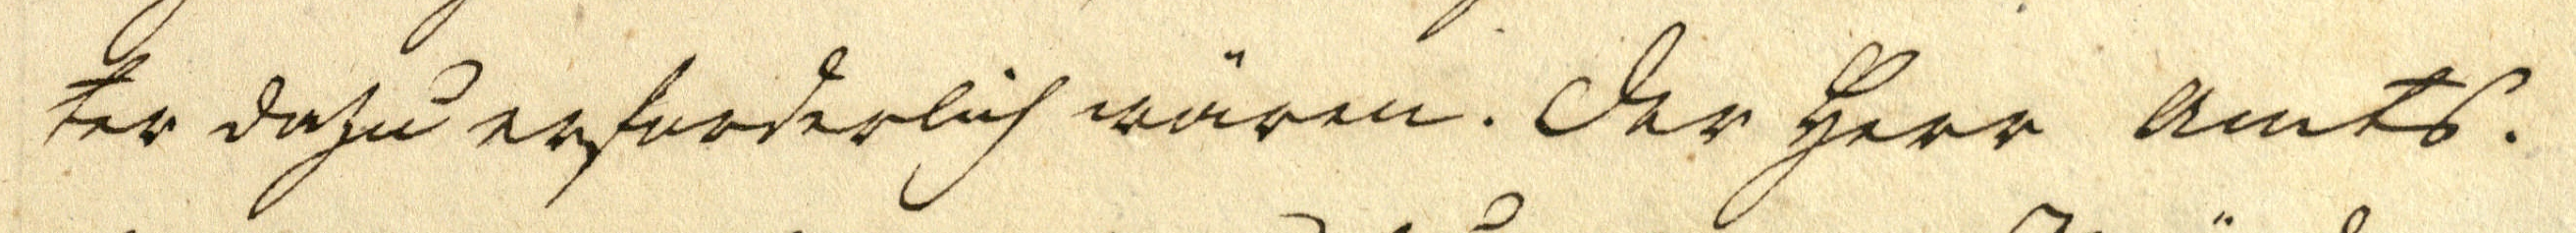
ter dazu erforderlich wären. Der Herr Amts¬
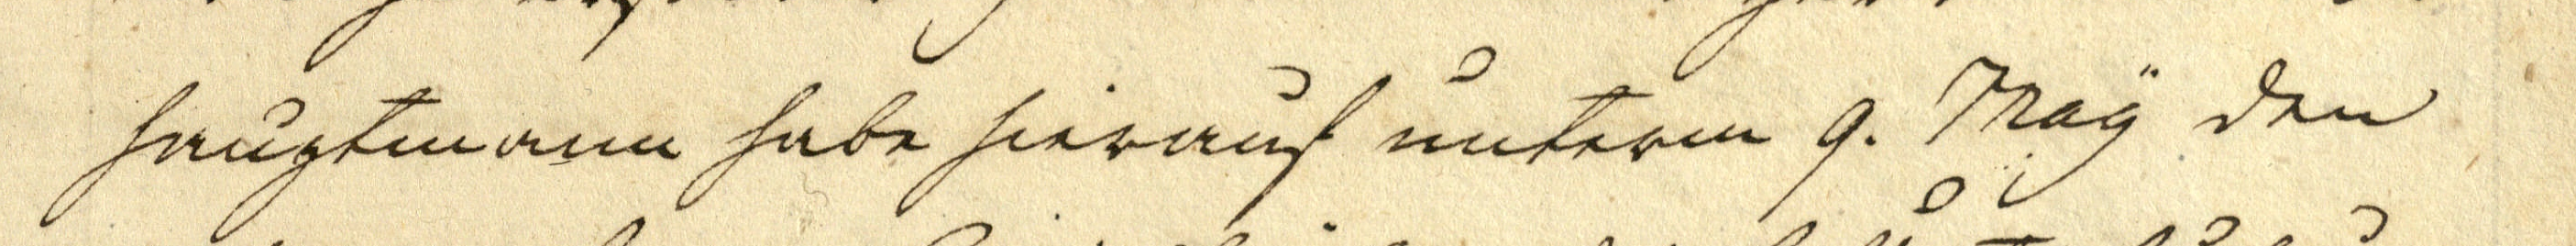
hauptmann habe hierauf unterm 9. Maÿ den
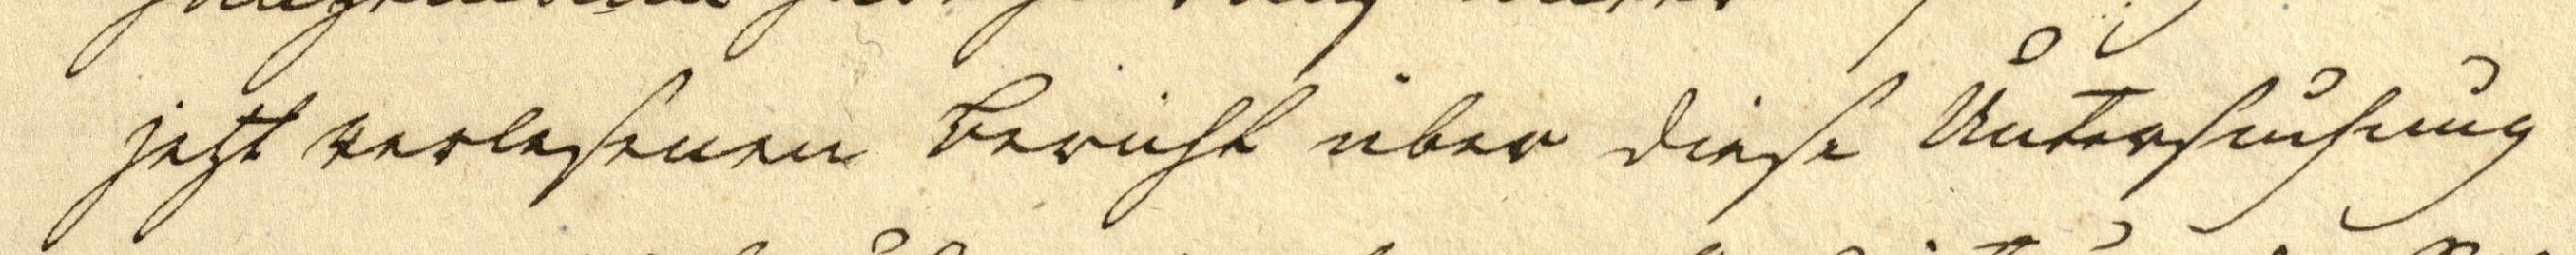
jezt verlesenen Bericht über diese Untersuchung
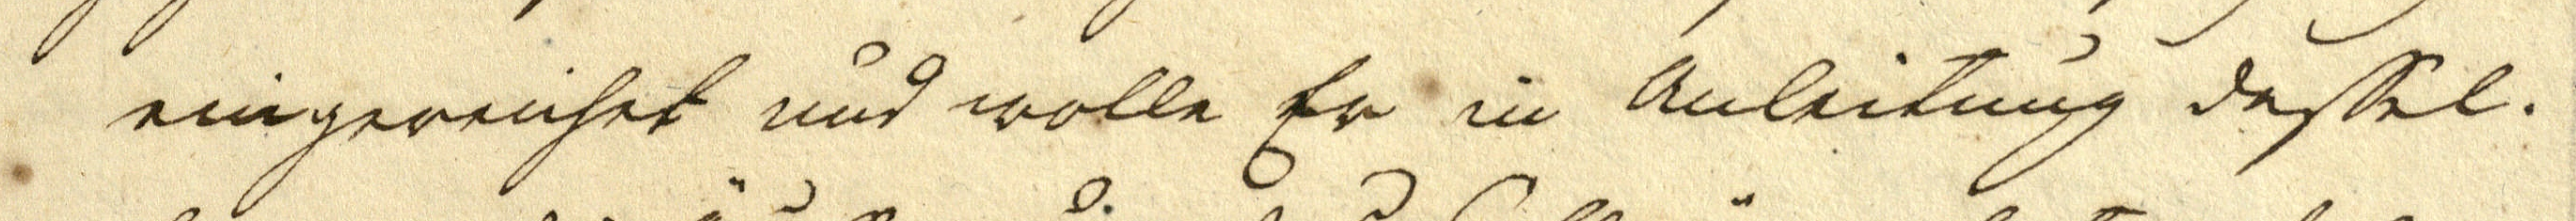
eingereichet und wolle Er in Anleitung dessel¬
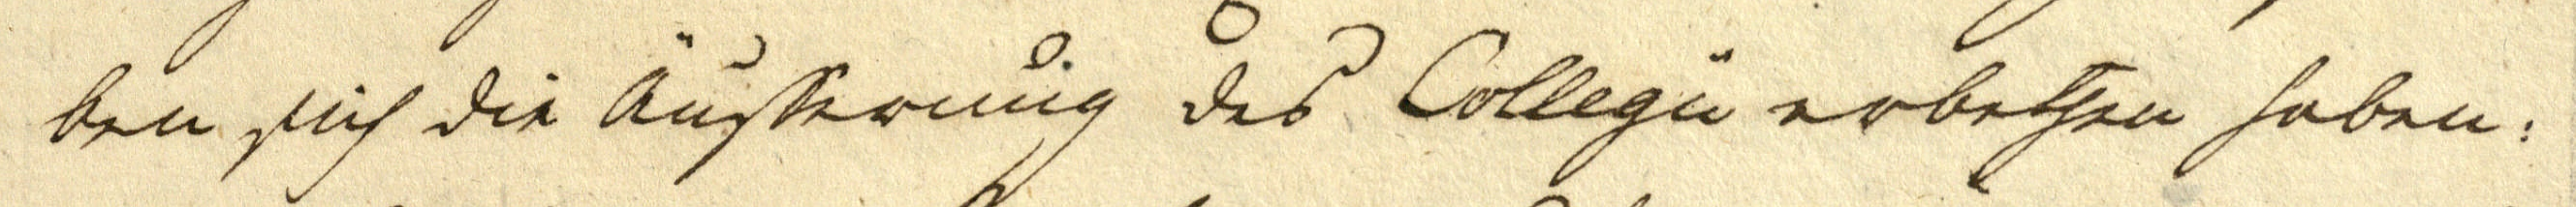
ben sich die Äusserung des Collegii erbethen haben:
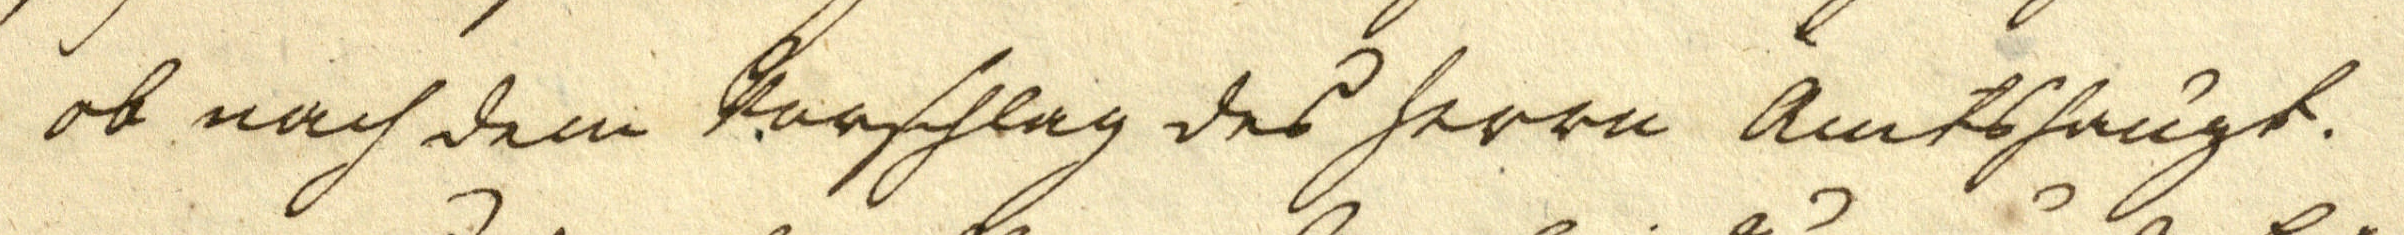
ob nach dem Vorschlag des Herrn Amtshaupt¬
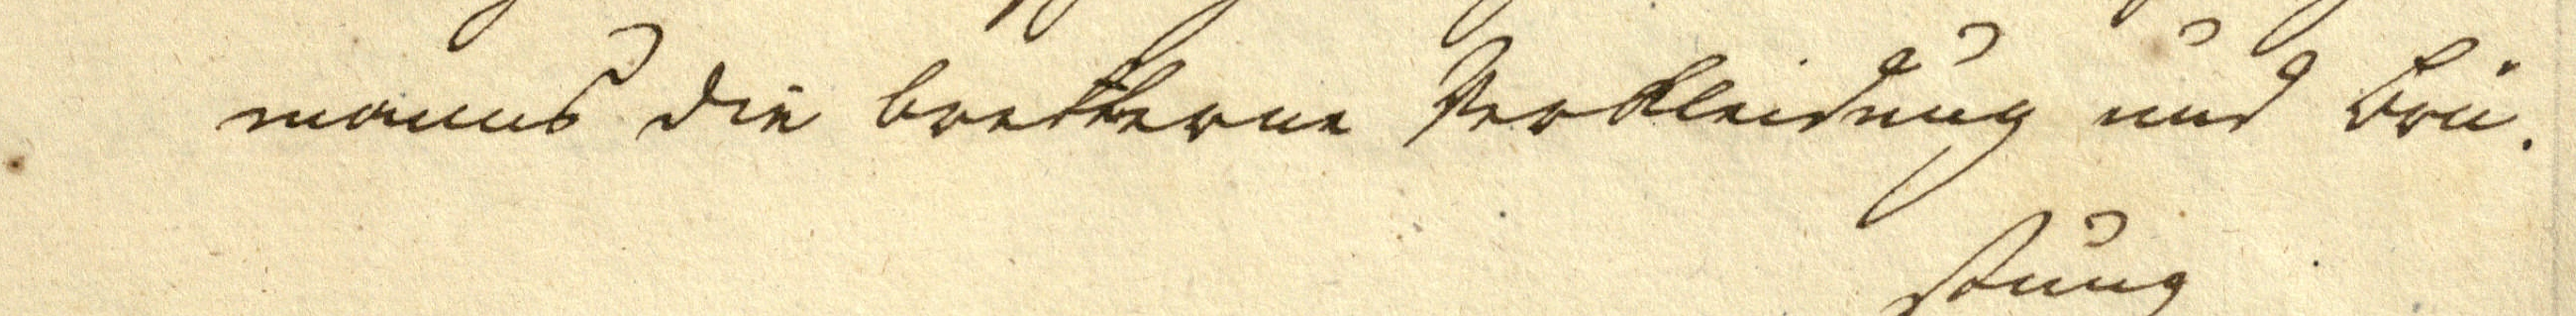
manns die bretterne Verkleidung und Brü¬
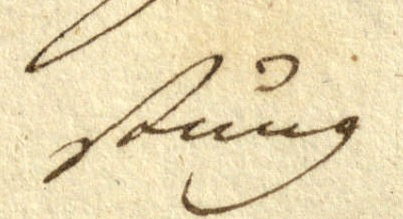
stung
